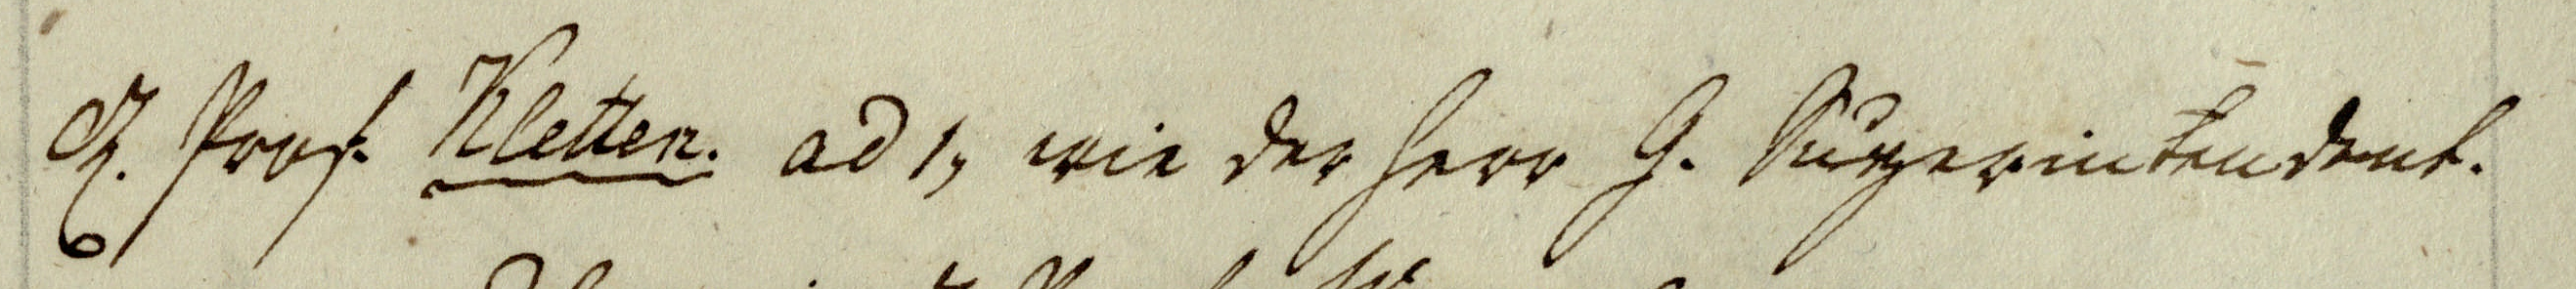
dh. Prof. Kletten. ad 1., wie der Herr G. Superintendent.
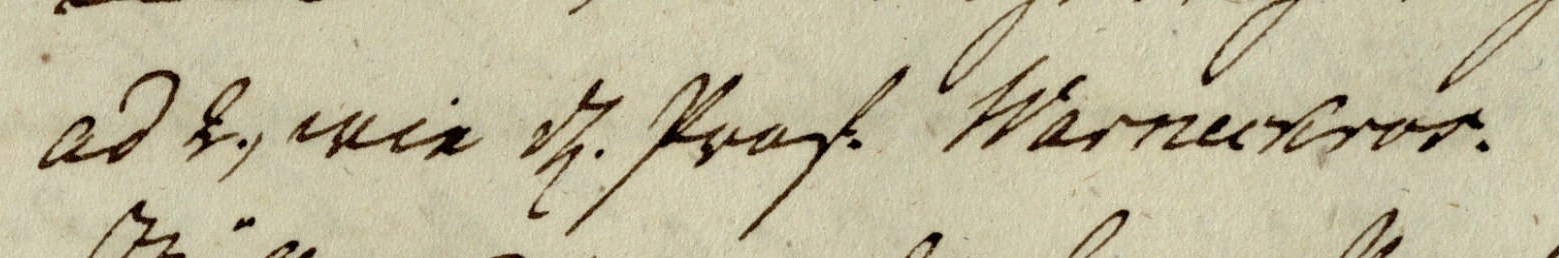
ad 2., wie dh. Prof. Warneckros.
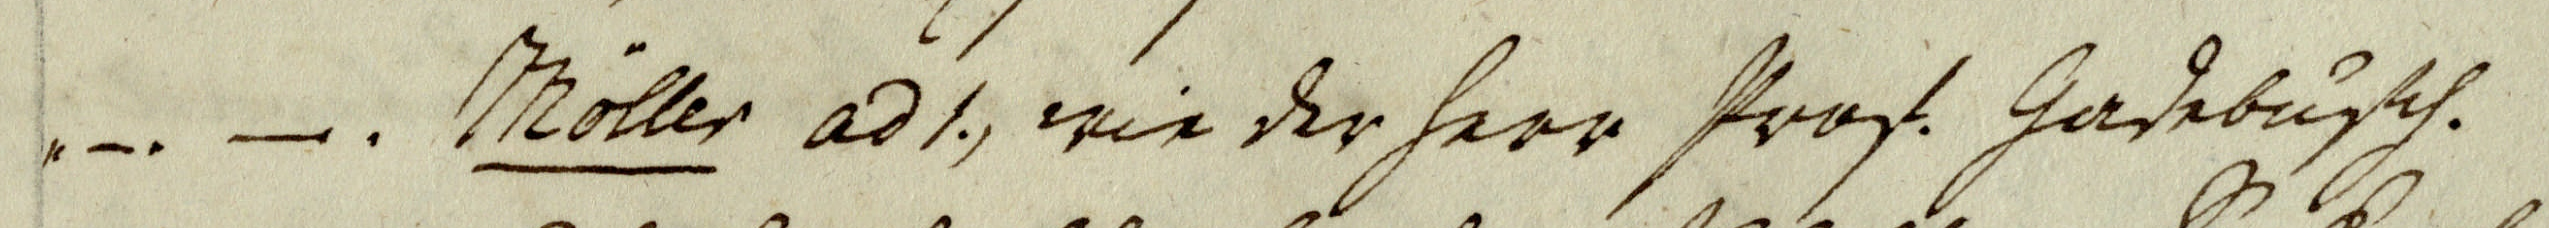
Möller ad 1., wie der Herr Prof. Gadebusch.
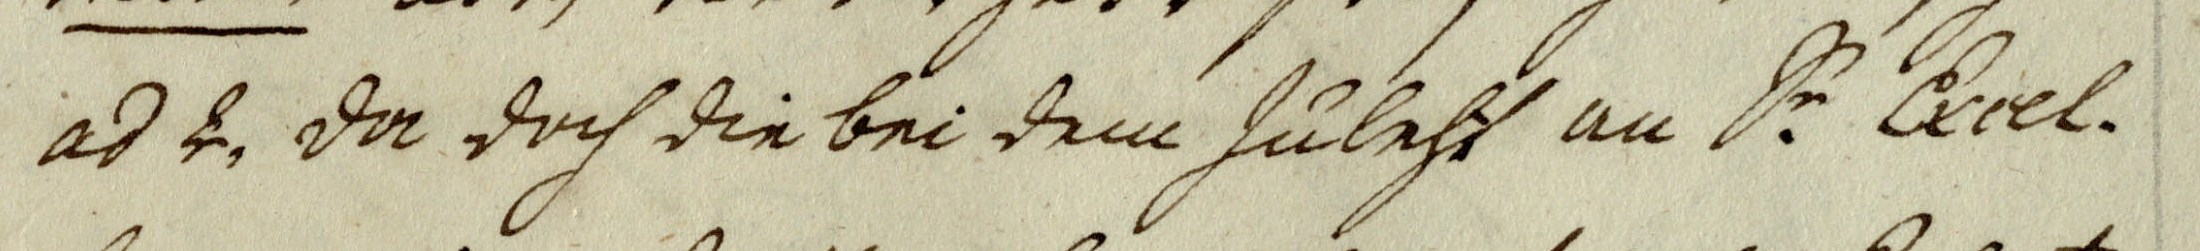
ad 2. Da doch die bei dem zuletzt an Sr Excel¬
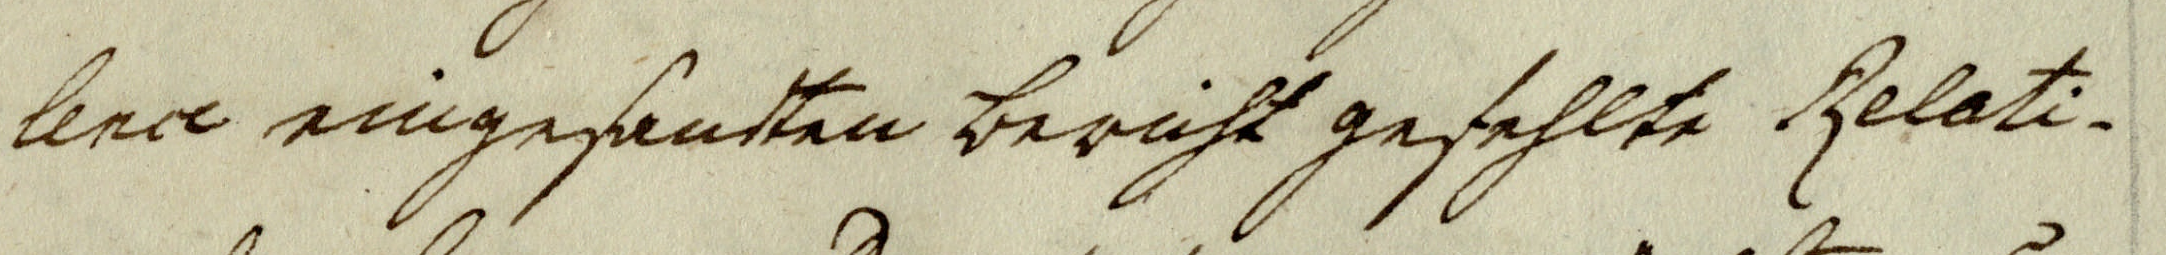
lence eingesandten Bericht gefehlte Relati¬
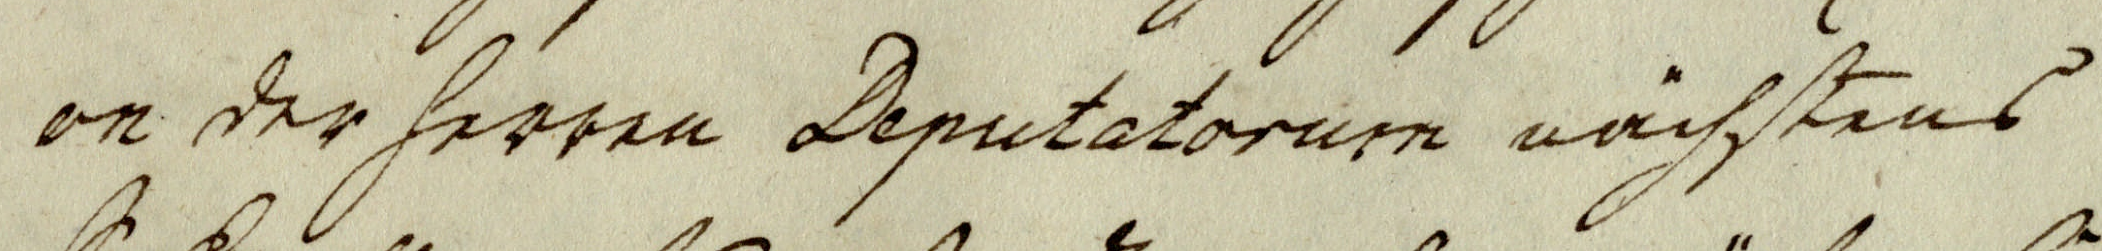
on der Herren Deputatorum nächstens
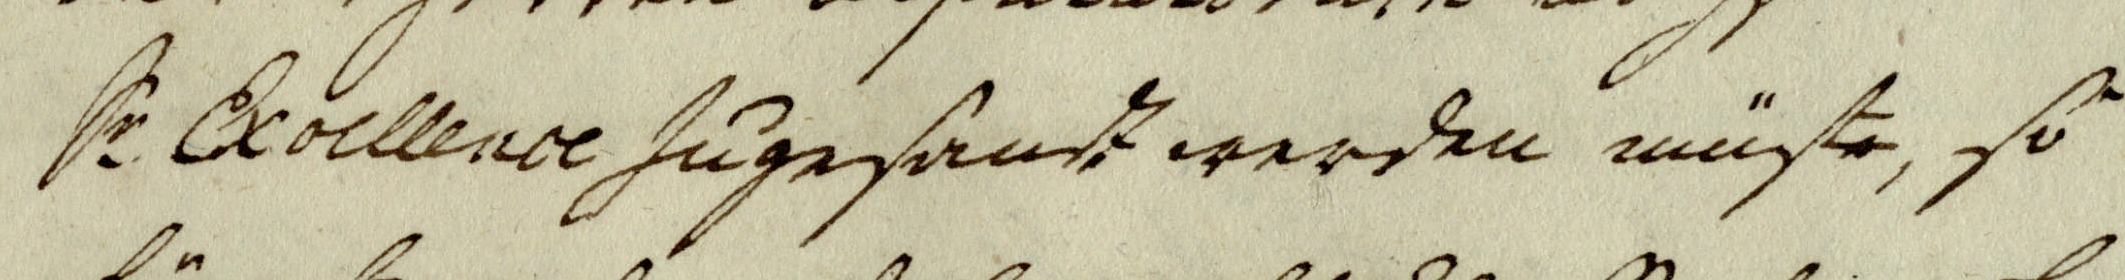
Sr Excellence zugesandt werden müßte, so
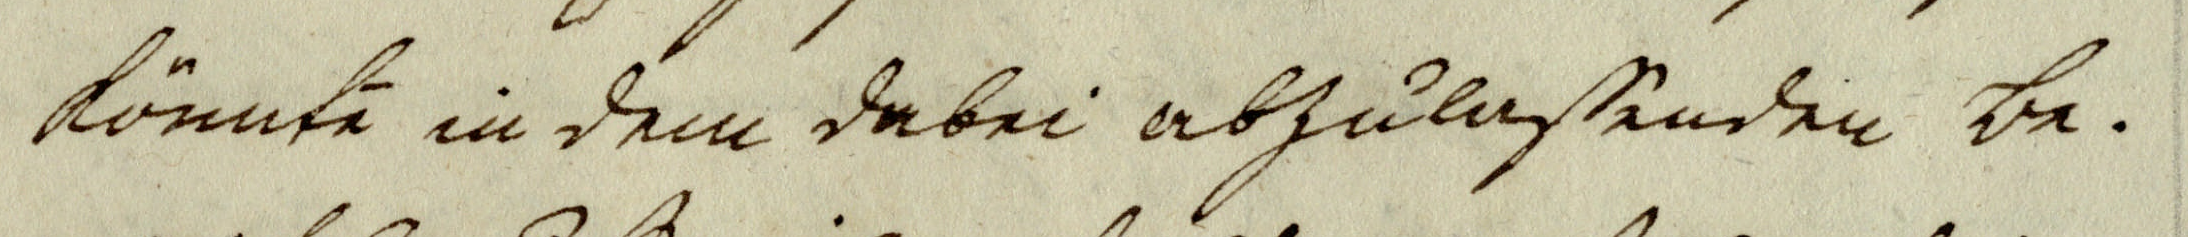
könnte in dem dabei abzulassenden Be¬
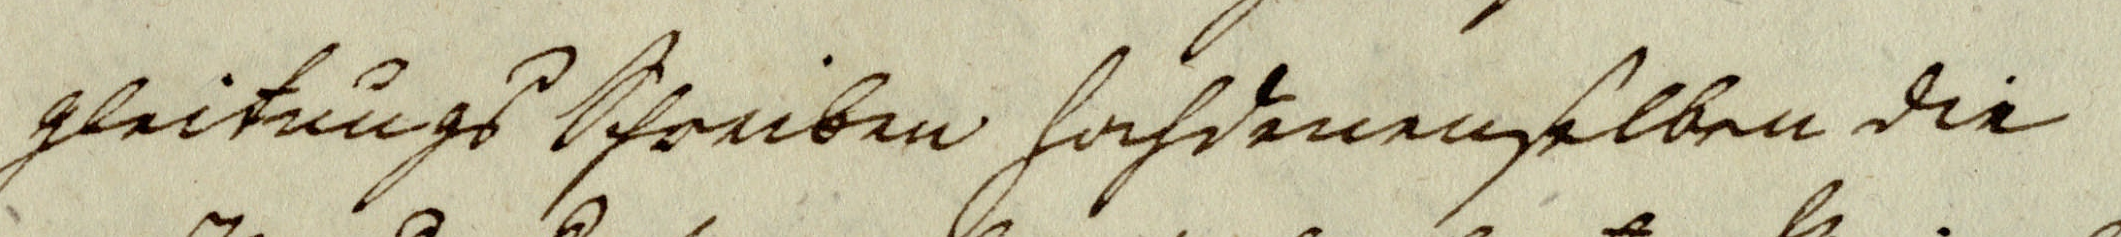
gleitungs Schreiben hochdenenselben die
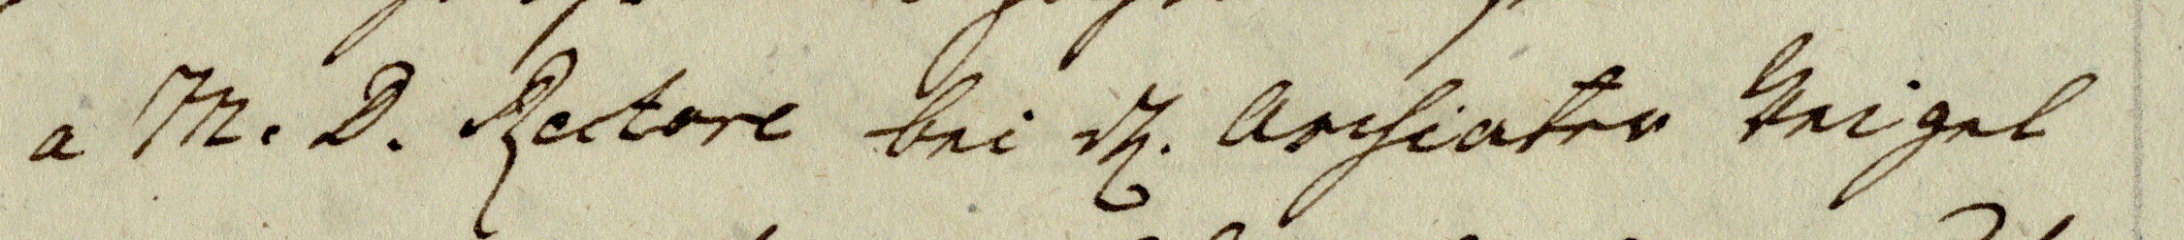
a M. D. Rectore bei dh. Archiater Weigel
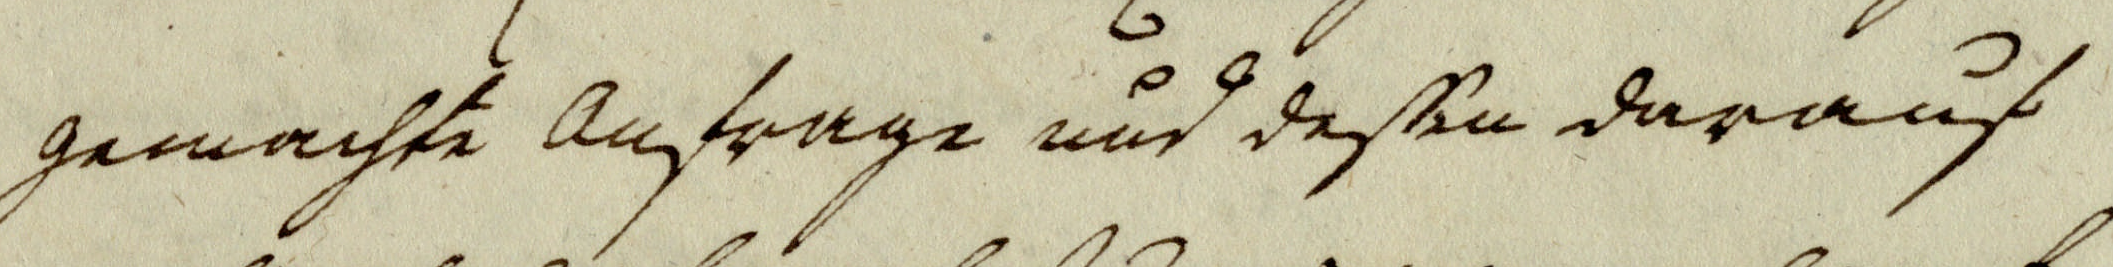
gemachte Anfrage und dessen darauf
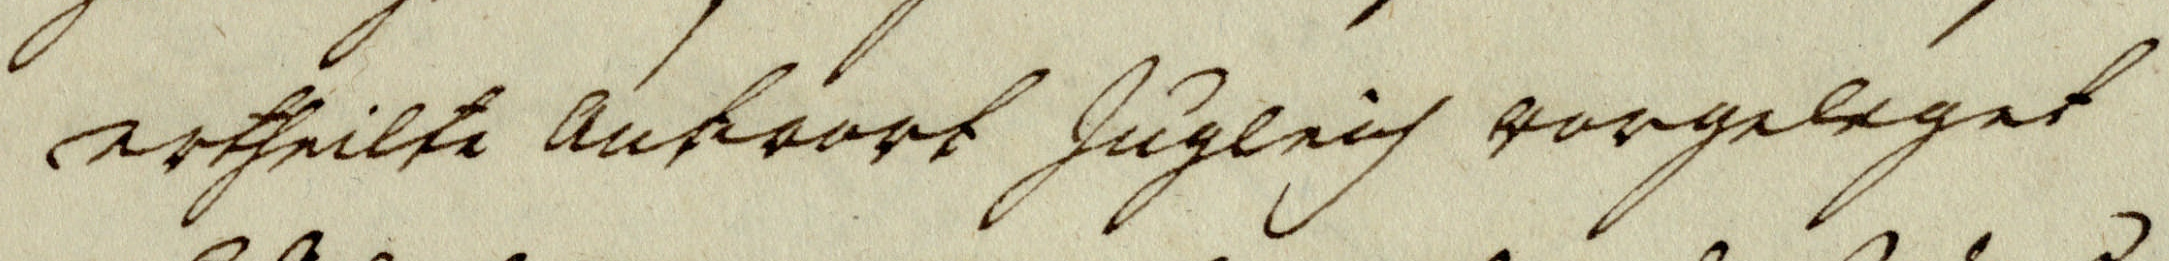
ertheilte Antwort zugleich vorgeleget
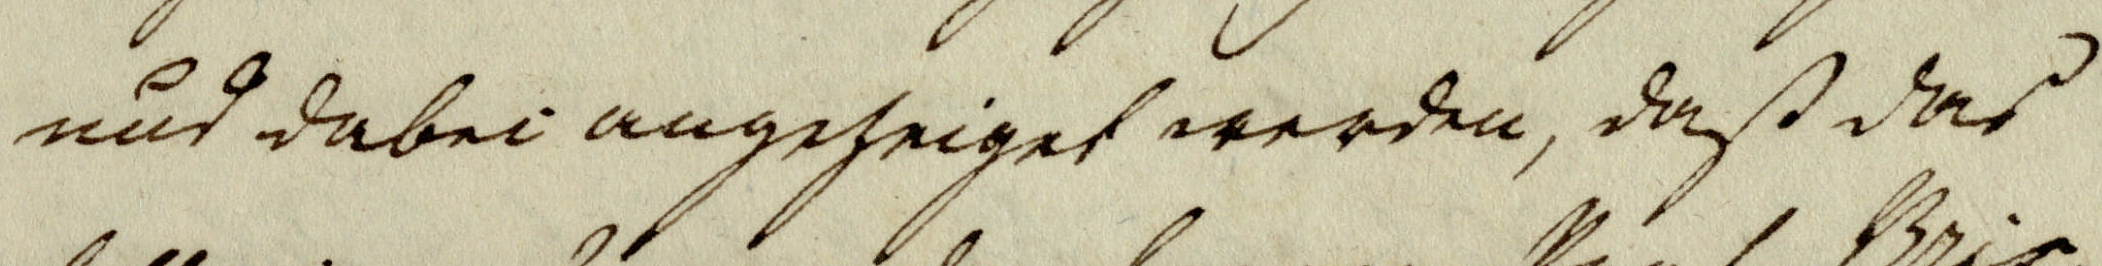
und dabei angezeiget werden daß das
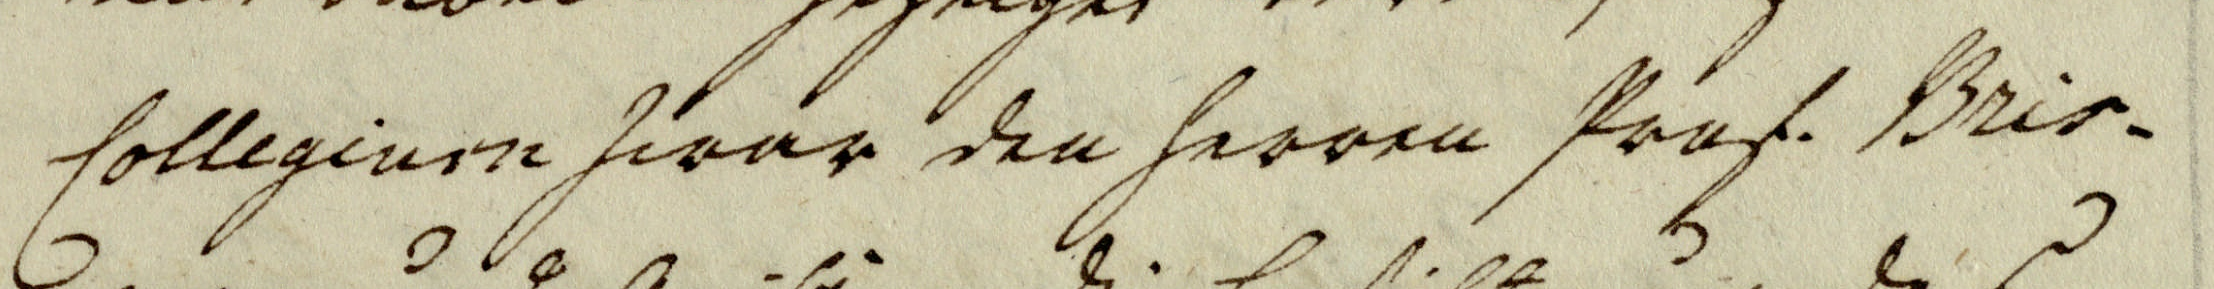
Collegium zwar den Herren Prof. Bris¬
